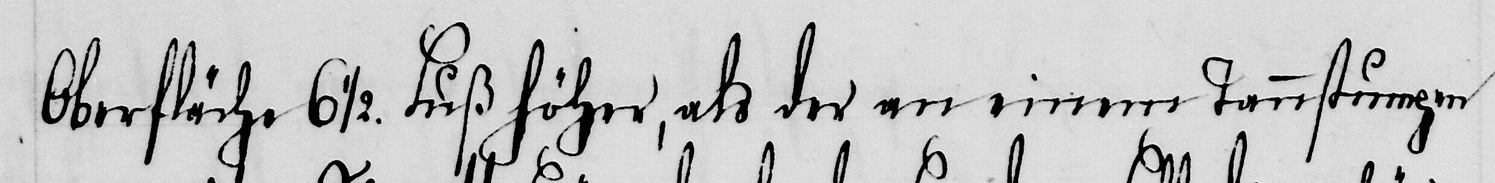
Oberfläche 6 1/2. Fuß höher, als der an einem Tannstumpen
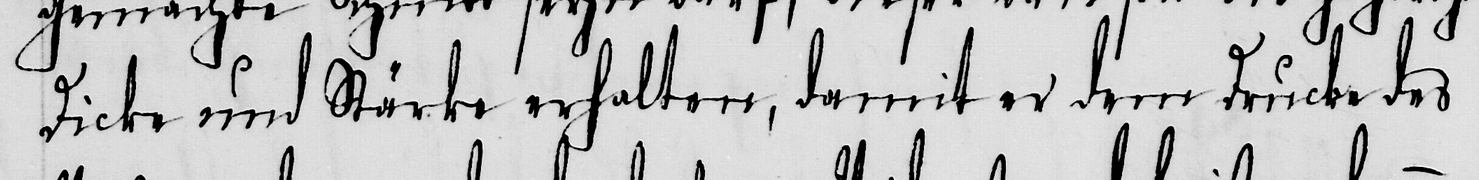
Dicke und Stärke erhalten, damit er dem Drucke des
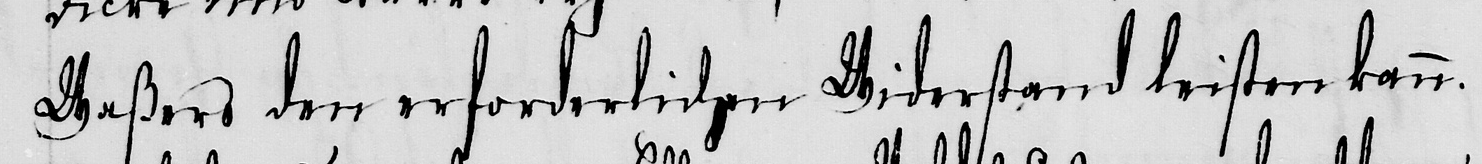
Waßers den erforderlichen Widerstand leisten kann.
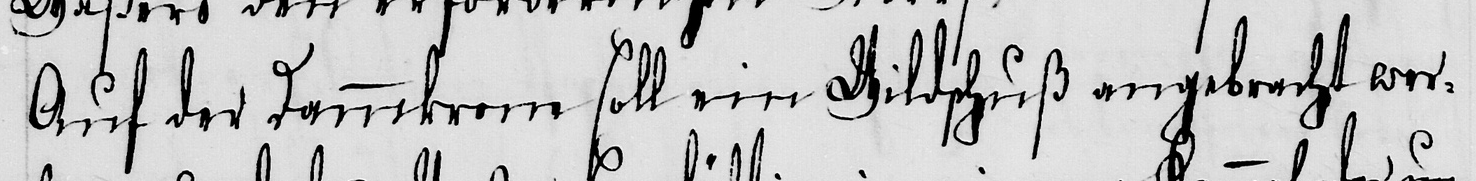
Auf der Dammkrone soll ein Wildschuß angebracht wer¬
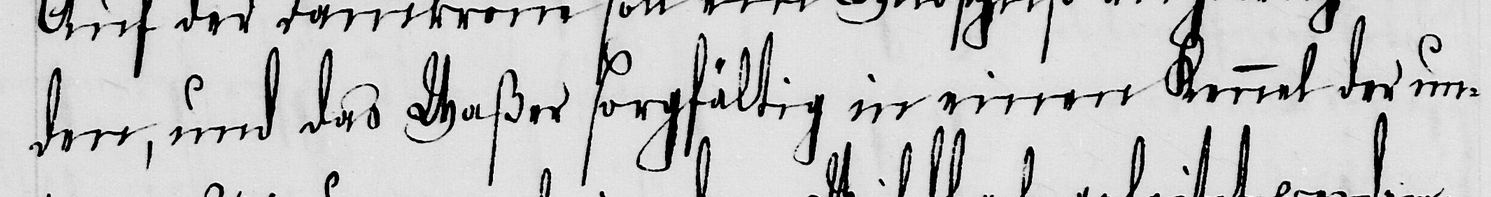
den, und das Waßer sorgfältig in einen Kanal der un¬
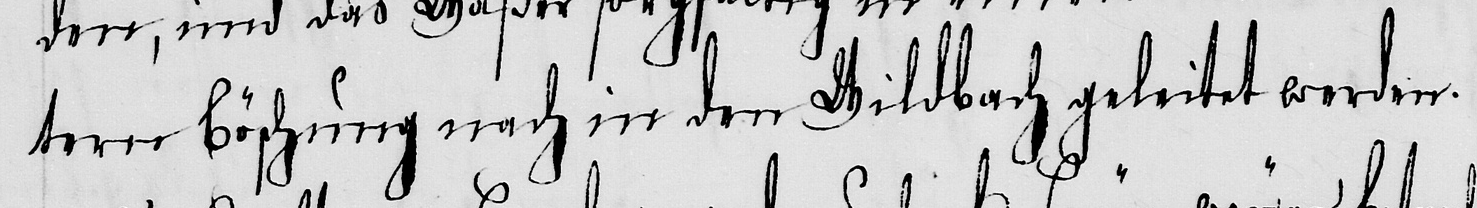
tern Böschung nach in den Wildbach geleitet werden.
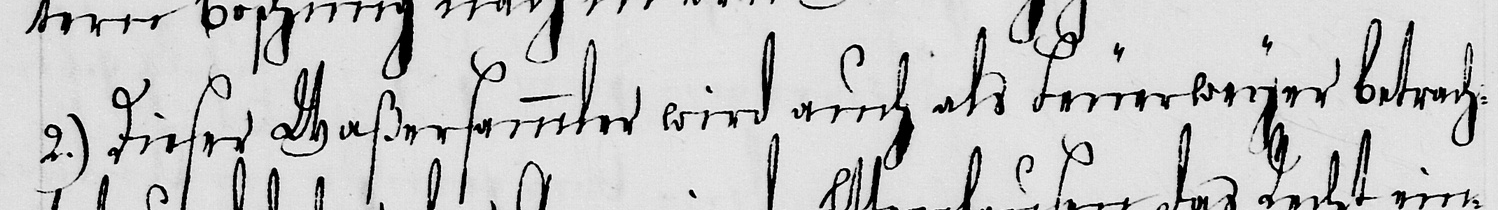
2.) Dieser Waßersammler wird auch als Feuerweyer betrach¬
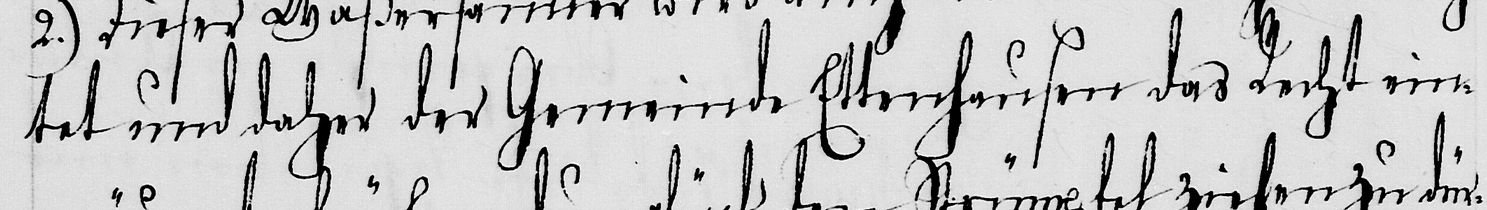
tet und daher der Gemeinde Ettenhausen das Recht ein¬
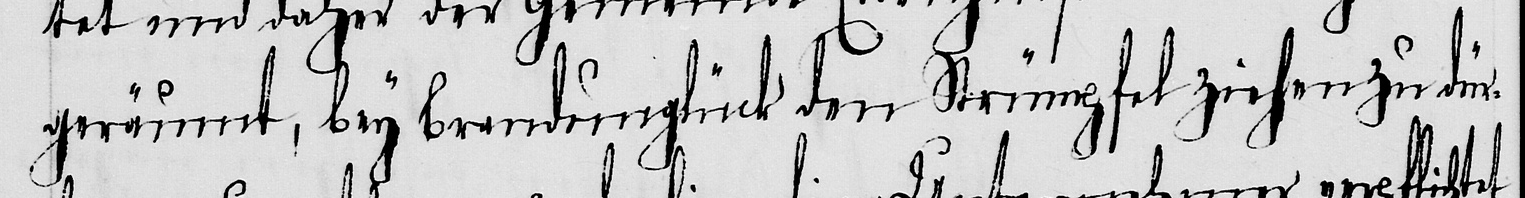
geräumt, bey Brandunglück den Strümpfel ziehen zu dür¬
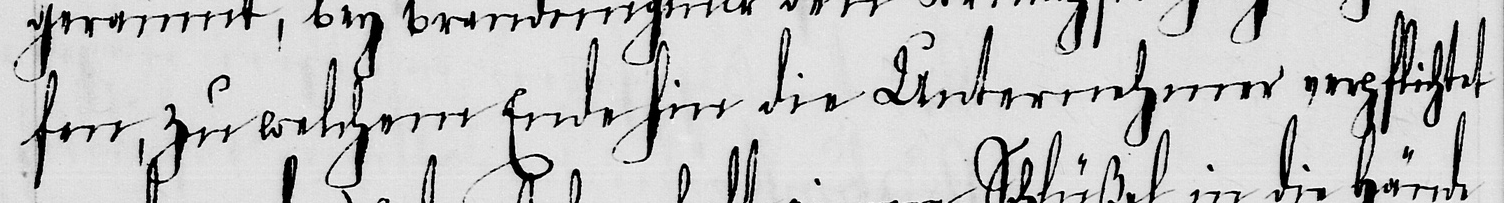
fen zu welchem Ende hin die Unternehmer verpflichtet
